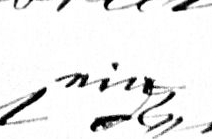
ein
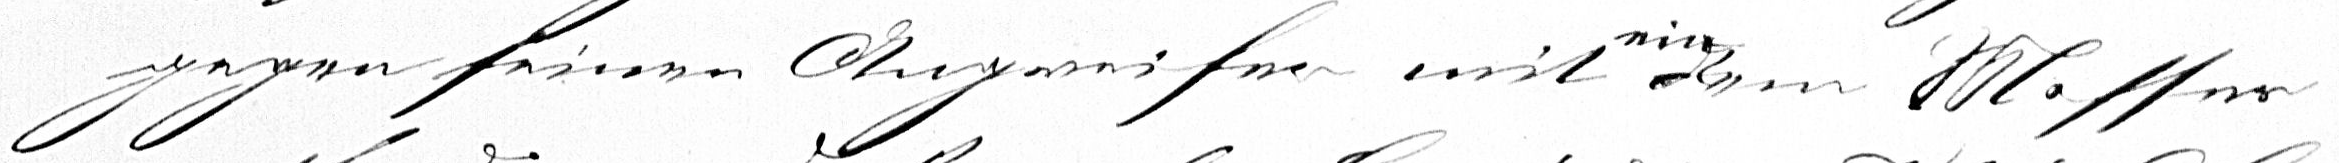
gegen seinen Angreifer mit dem Messen
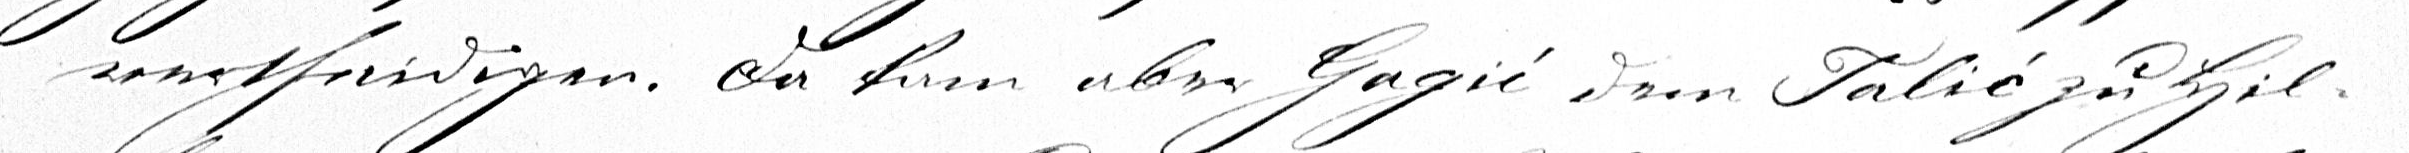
vertheidigen. Da kam aber Gagić dem Talić zu Hil¬
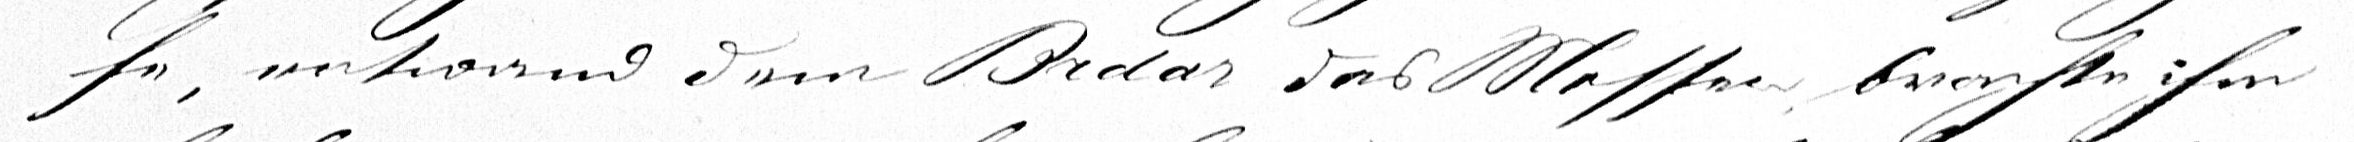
fe, entwand dem Brdar das Messen brachte ihm
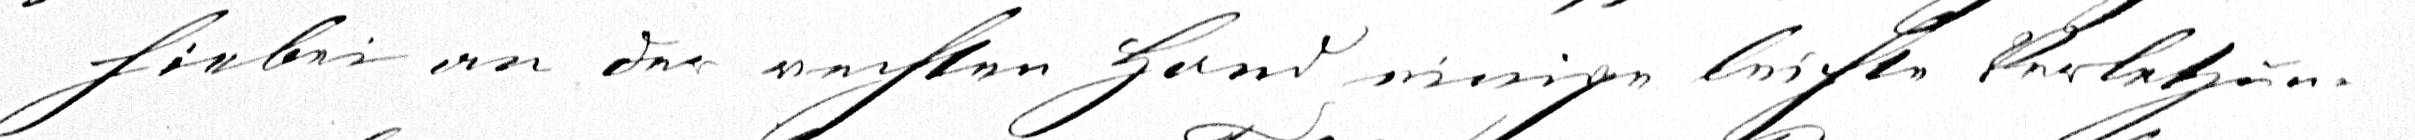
hiebei an der rechten Hand einige leichte Verletzun¬
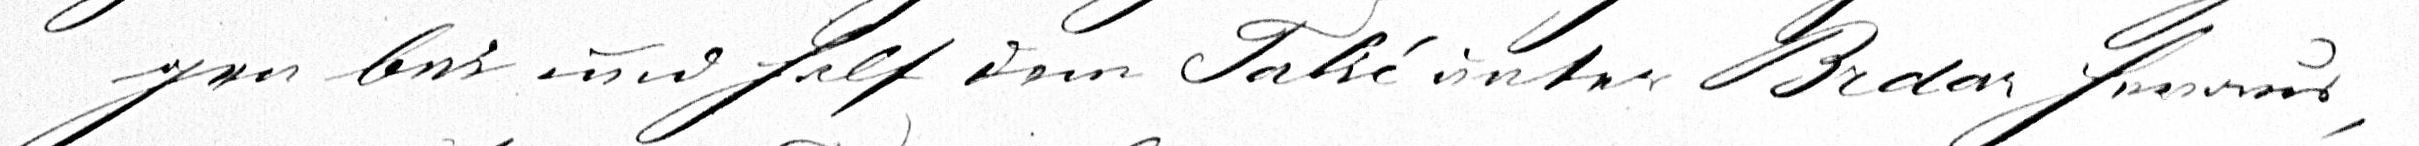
gen bei und half dem Talić unter Brdar heraus,
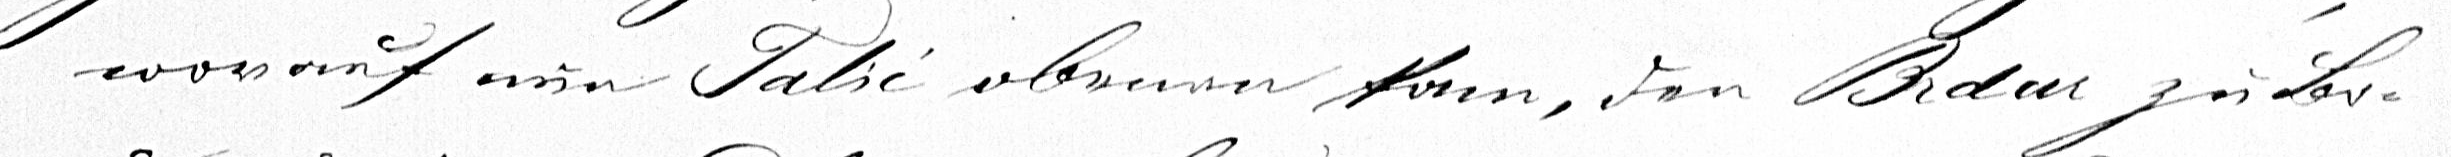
worauf nun Talić obenan kam, den Brdar zu Bo¬
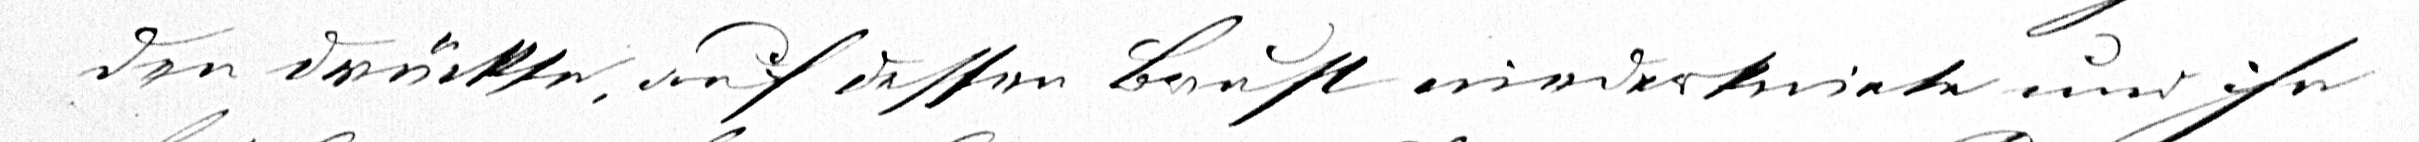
den drückte, auf dessen Brust niederkniete und ihn
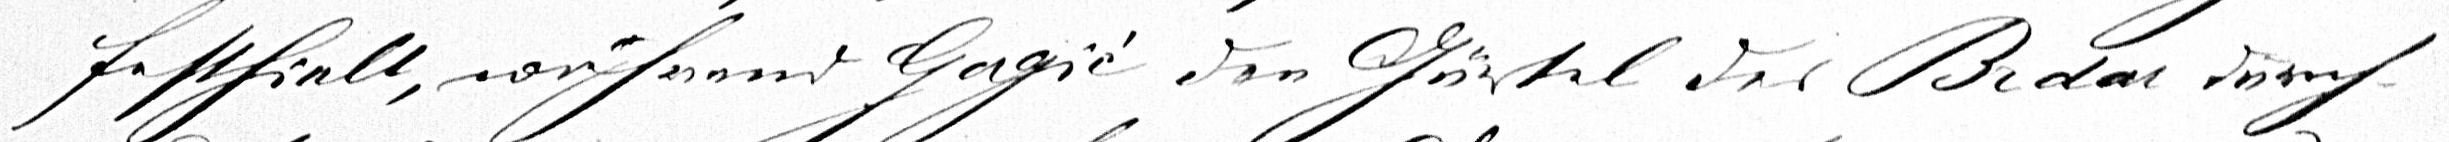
festhielt, während Gagić den Gürtel des Brdar durch
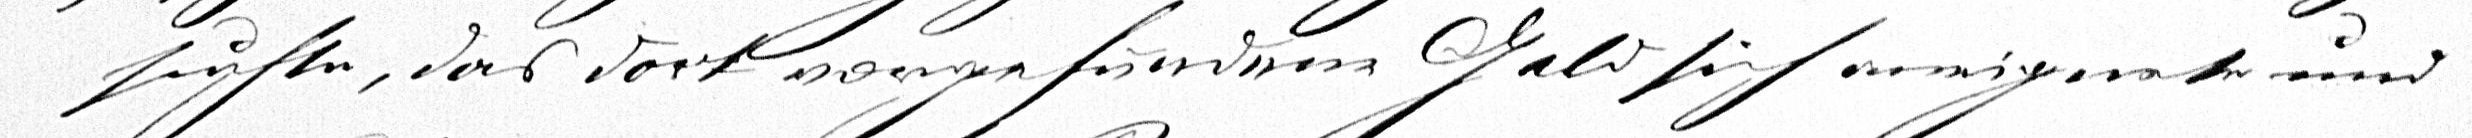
suchte, das dort vorgefundene Geld sich xxgnete und
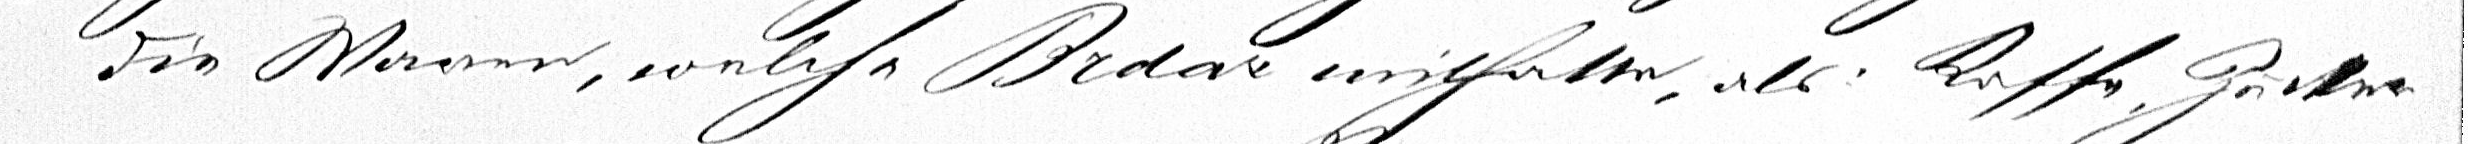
die Waren, welche Brdar mithalte, als Rasse, Zucker
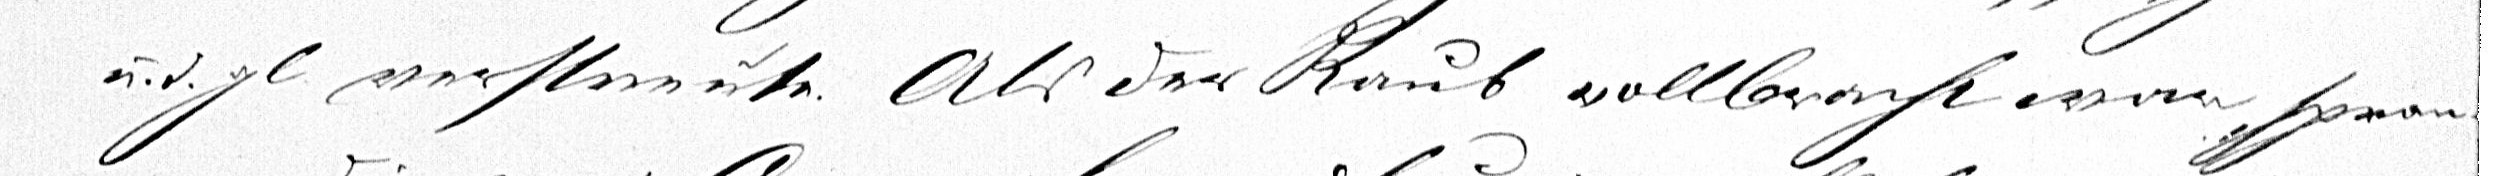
u. d. gl verstreute. Als der Raub vollbracht war spran¬
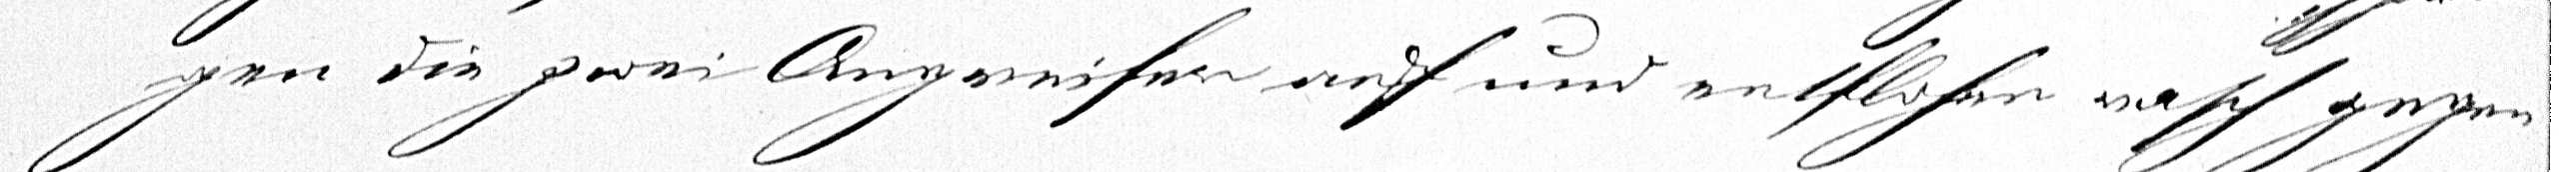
gen die zwei Angereifen auf und entflohen xxasch gegen
